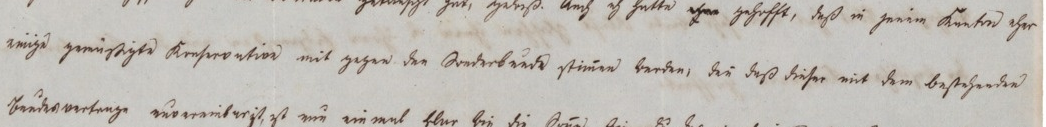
einige gemäßigte Konservative mit gegen den Sonderbunde stimmen werden, denn daß dieser mit dem bestehenden
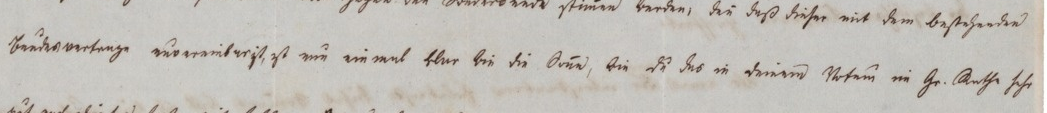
Bundesvertrage unvereinbar ist, ist nun einmal klar wie die Sonne, wie du das in deinem Votum im Gr. Rathe sehr
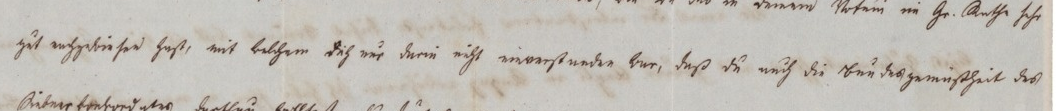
gut nachgewiesen hast, mit welchem ich nur darin nicht einverstanden war, daß du auch die Bundesgemäßheit des
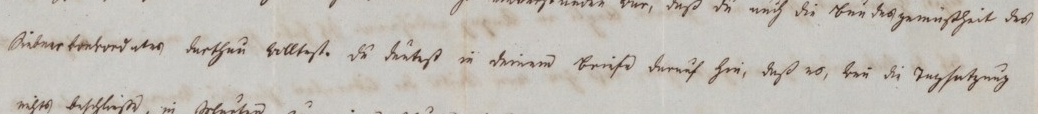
Siebnerkonkordates darthun wolltest. Du deutest in deinem Brief darauf hin, daß es, wenn die Tagsatzung
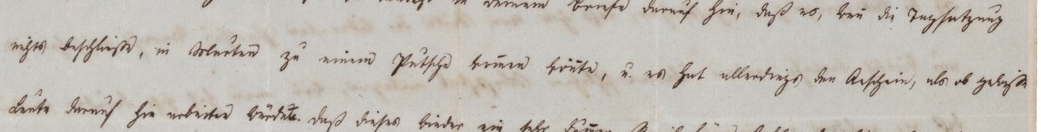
nichts beschließe, in Murten zu einem Putsche kommen könnte, u. es hat allerdings den Anschein, als ob gewisse
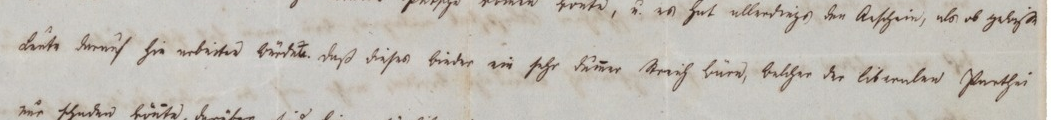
Leute darauf hin arbeiten würden. Daß dieses wieder ein sehr dummer Streich wäre, welcher der liberalen Parthei
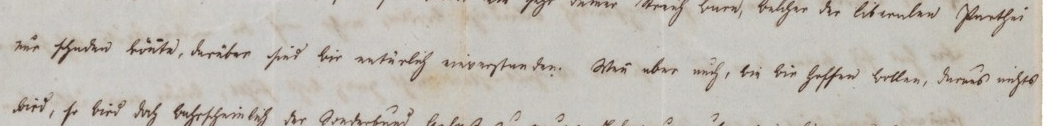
nur schaden könnte, darüber sind wir natürlich einverstanden. Wenn aber auch, wie wir hoffen wollen, daraus nichts
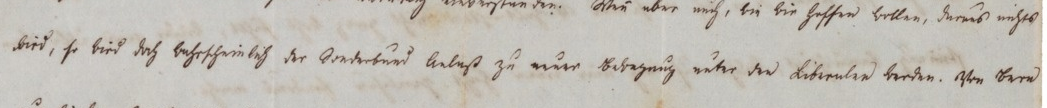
wird, so wird doch wahrscheinlich der Sonderbund Anlaß zu neuer Bewegung unter den Liberalen werden. Von Bern
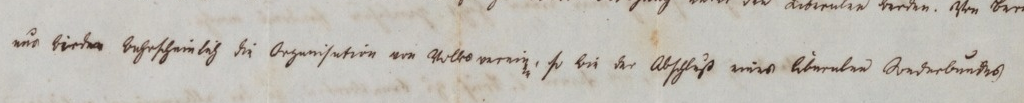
aus wird wahrscheinlich die Organisation von Volksvereinen, so wie der Abschluß eines liberalen Sonderbundes
